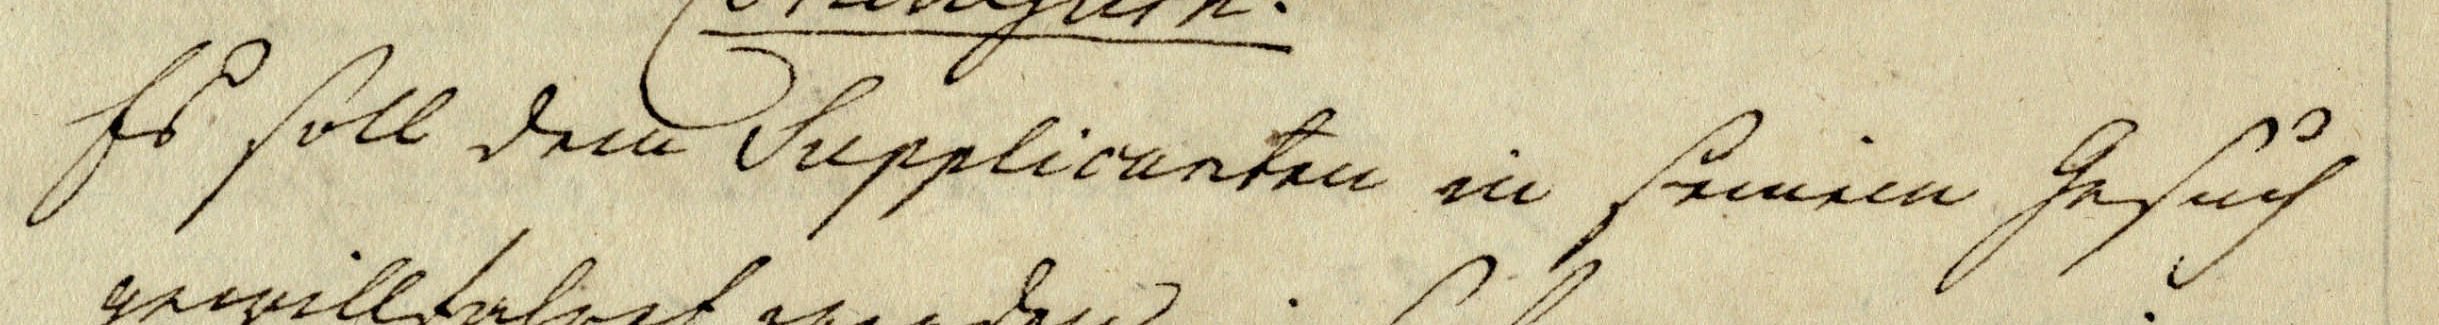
Es soll des Supplicanten in seinem Gesuch
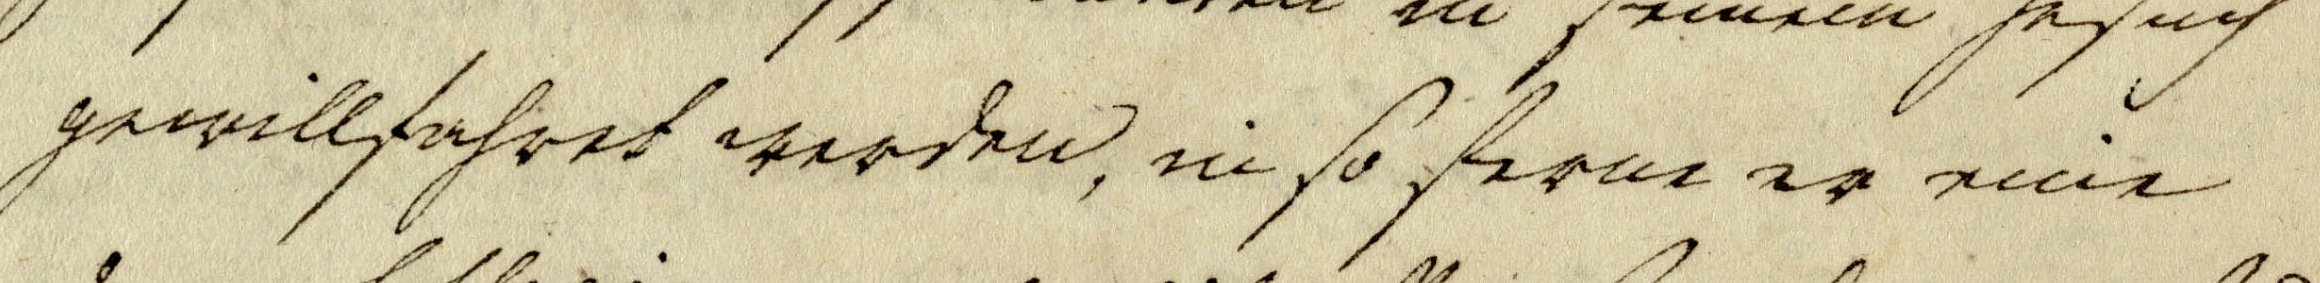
gewillfahret werden, in so ferne er eine
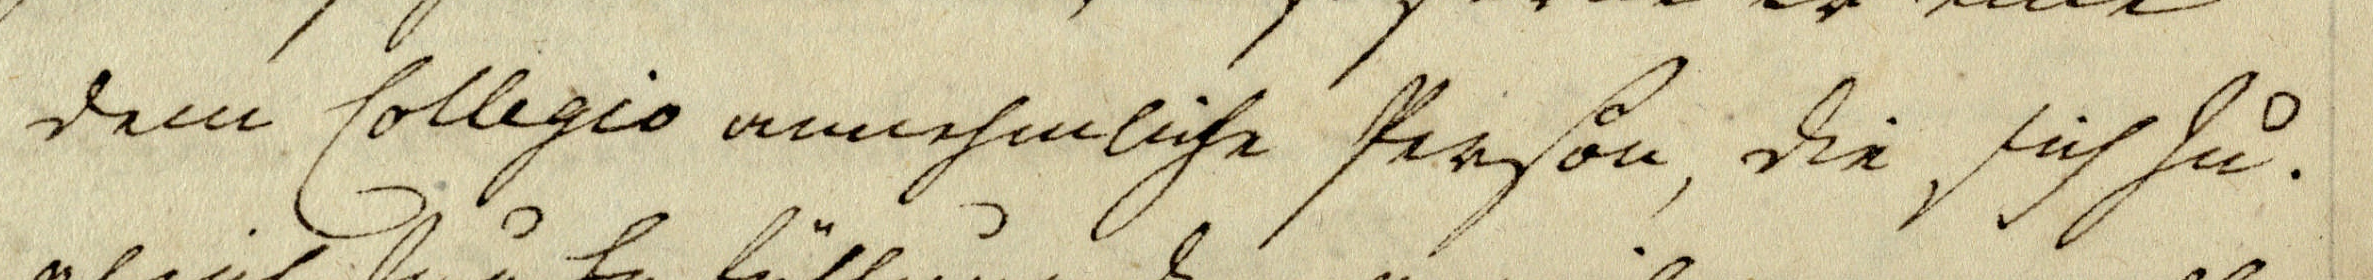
dem Collegio annehmliche Person, die sich zu¬
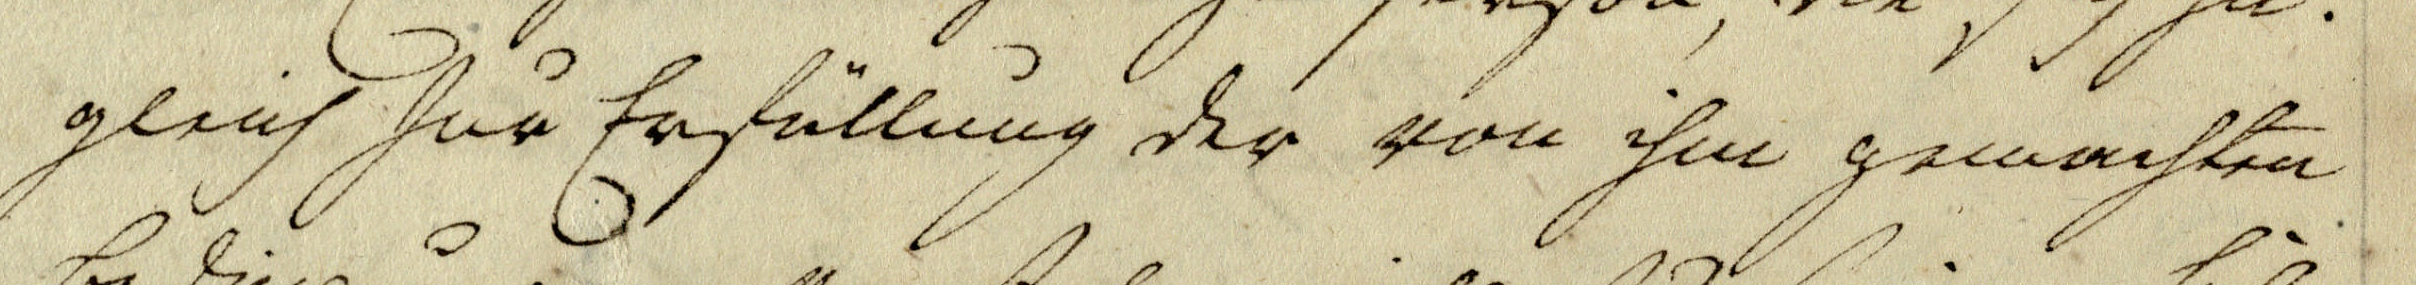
gleich zur Erfüllung der von ihm gemachten
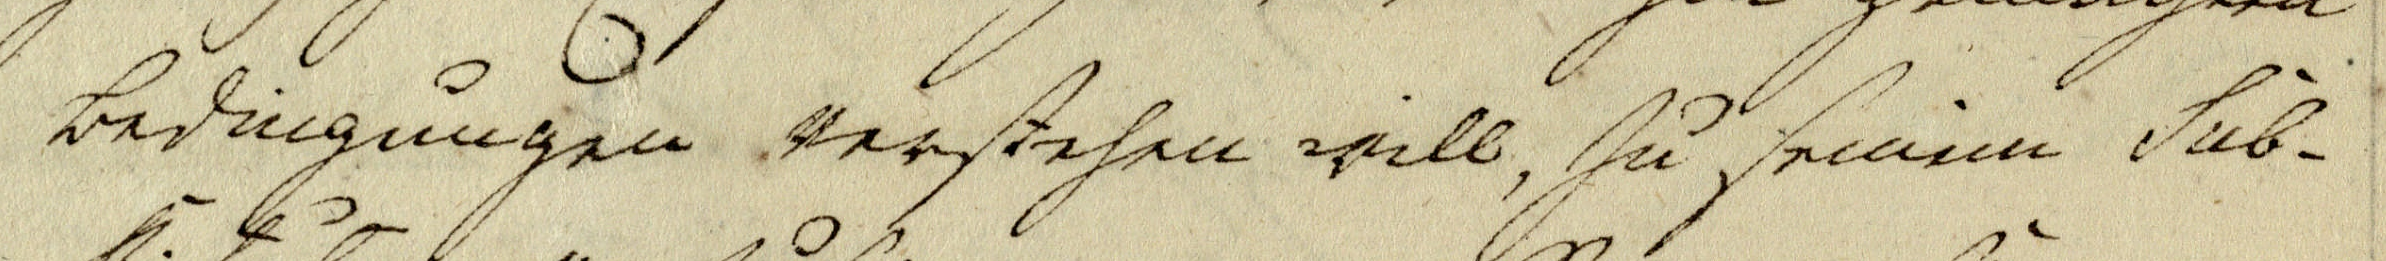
Bedingungen verstehen will, zu seinem Sub¬
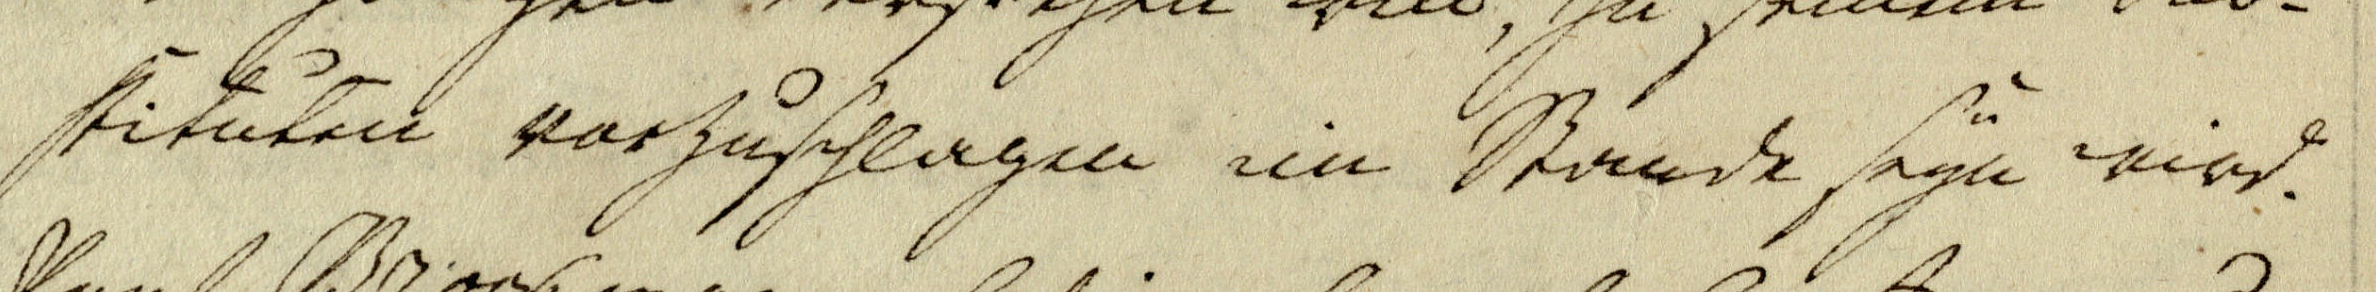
stituten vorzuschlagen im Stande seÿn wird.
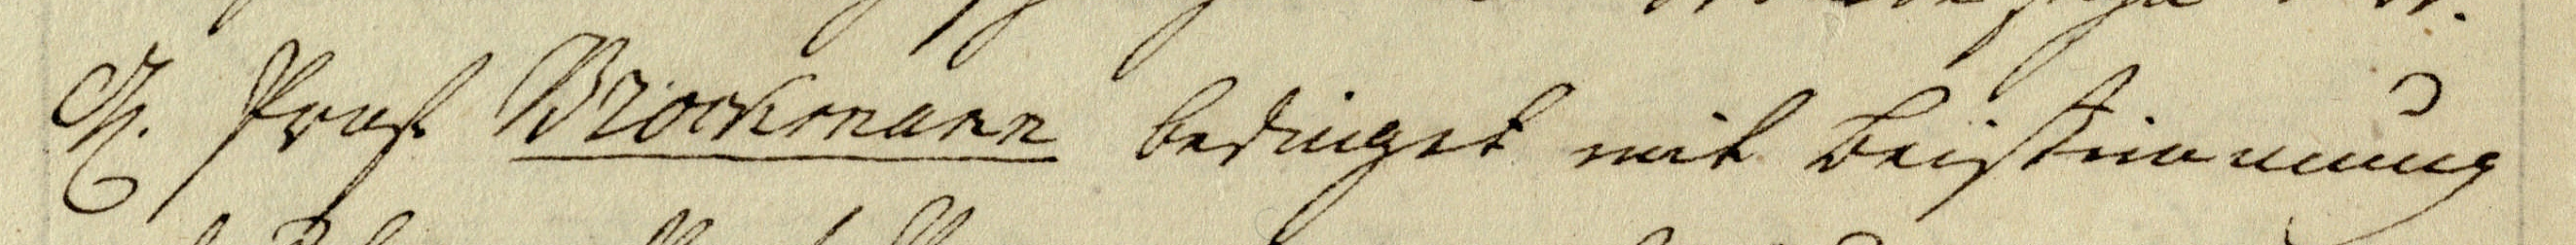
dh. Prof. Brockmann bedinget mit Beistinnmung
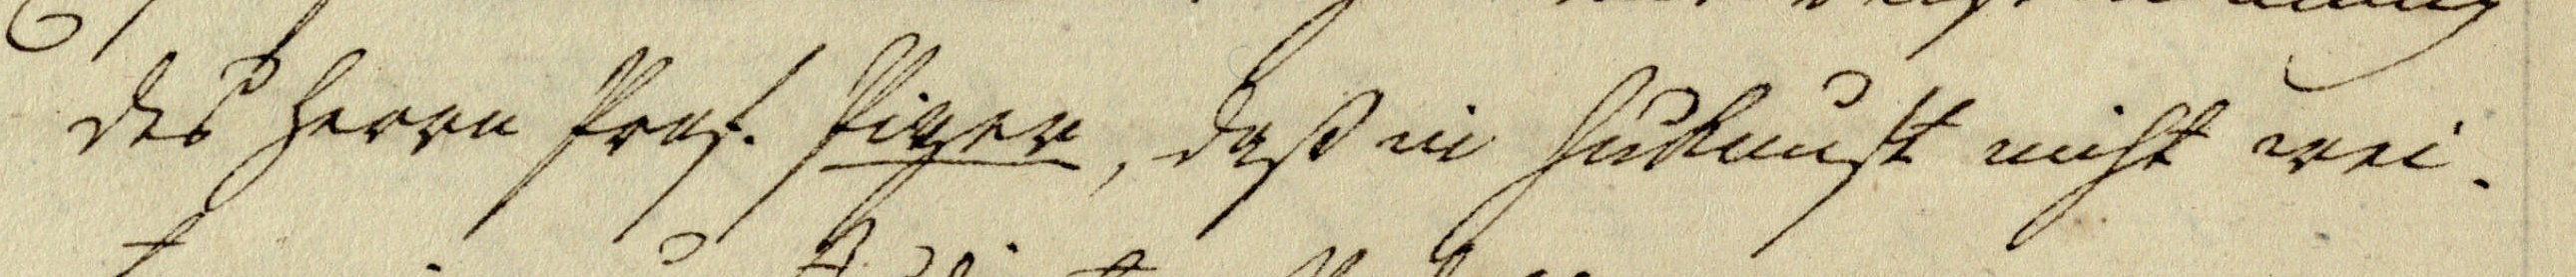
des Herrn Prof. Piper, daß in Zukunft nicht wei¬
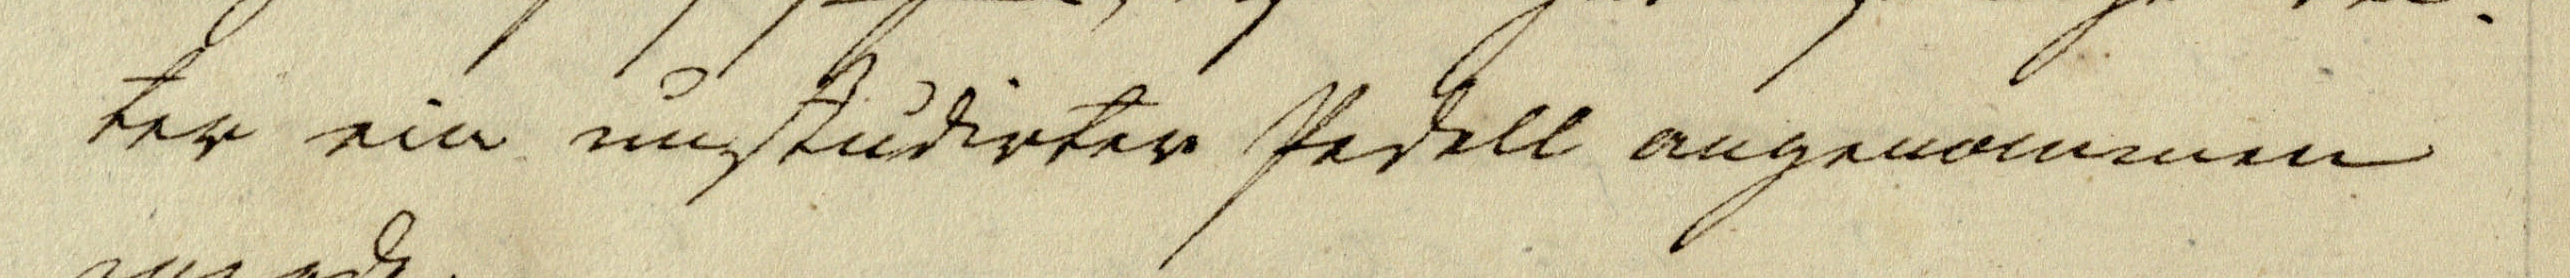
ter ein unstudirter Pedell angenommen
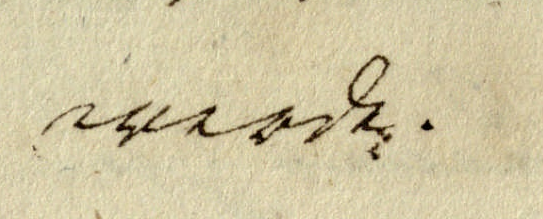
werde.
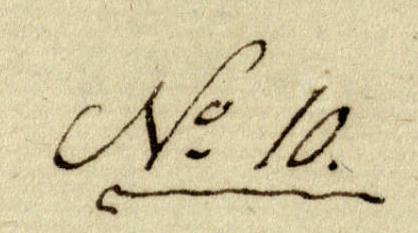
No 10.
